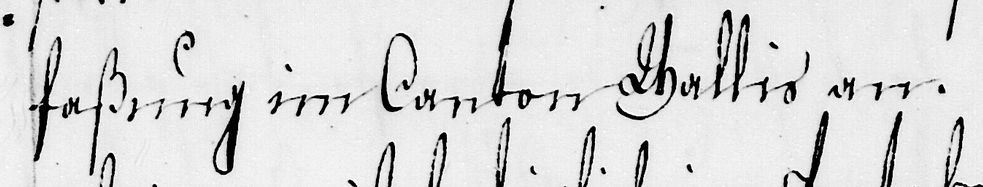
faßung im Canton Wallis an.
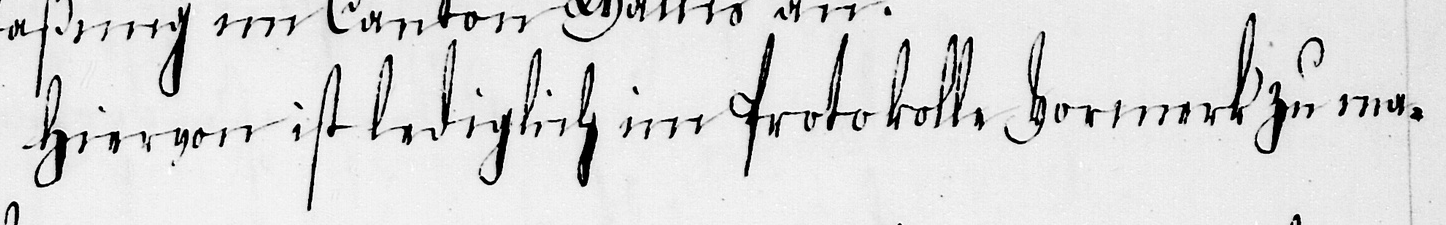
Hiervon ist lediglich im Protokolle Vormerk zu ma¬
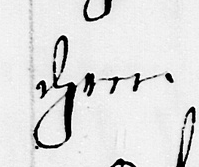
chen.
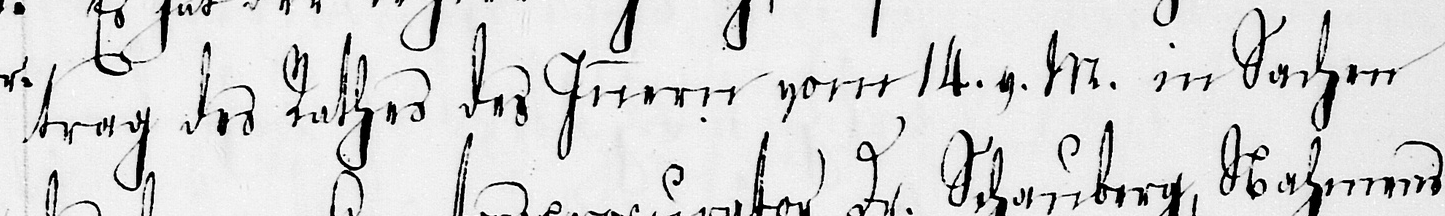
trag des Rathes des Innern vom 14. v. M. in Sachen
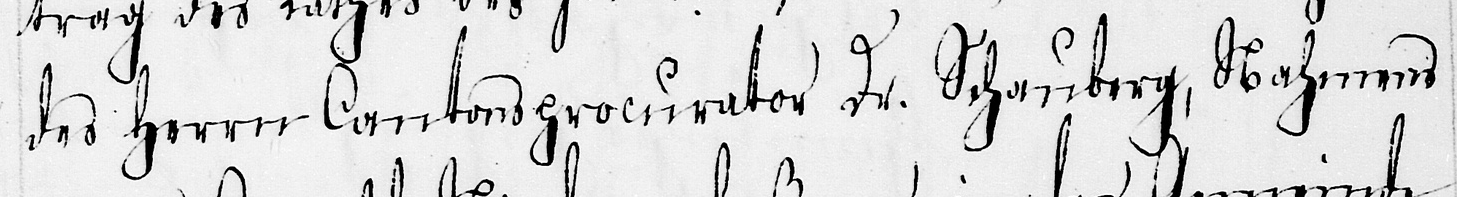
des Herrn Cantonsprocurator Dr. Schauberg, Nahmens
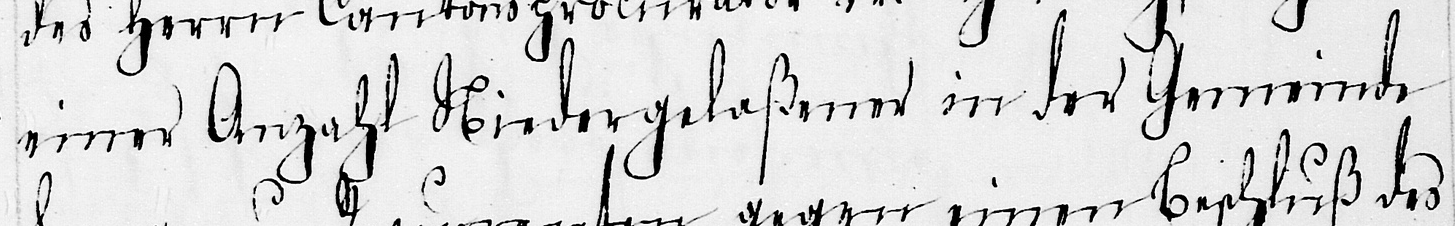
einer Anzahl Niedergelaßener in der Gemeinde
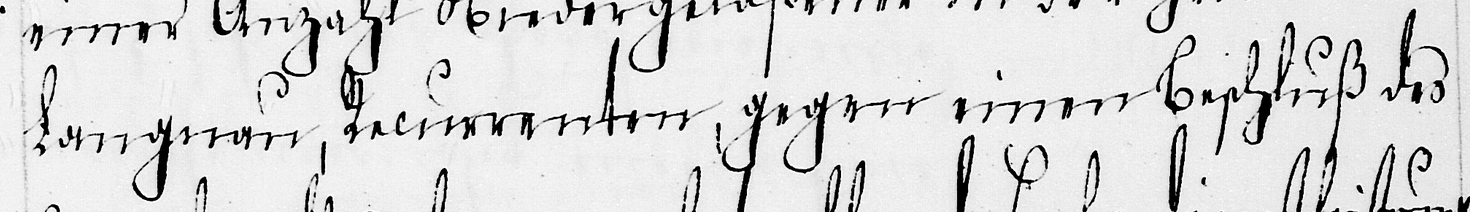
Langnau, Recurrenten, gegen einen Beschluß des
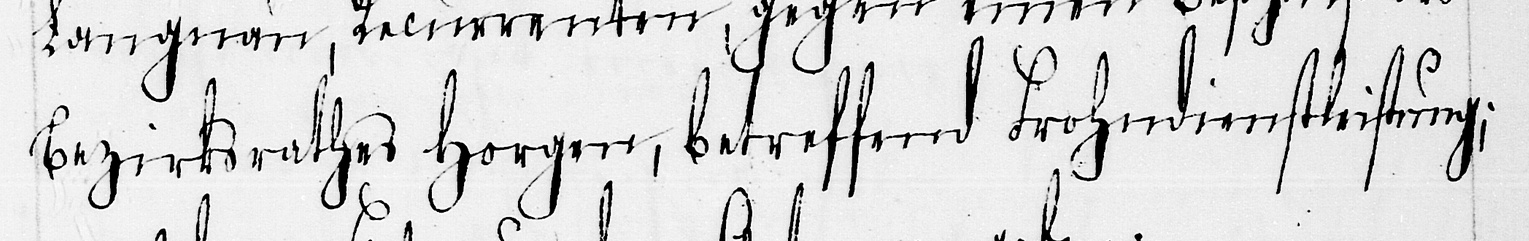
Bezirksrathes Horgen, betreffend Frohndienstleistung;
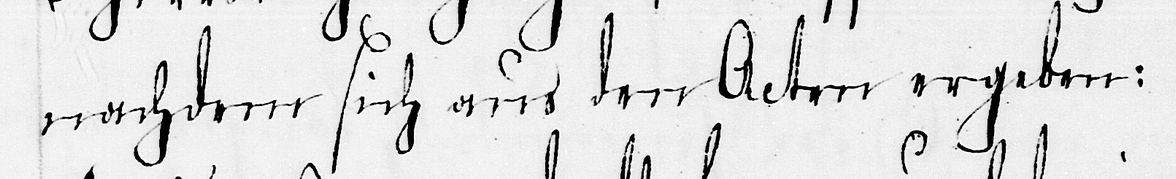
nachdem sich aus den Acten ergeben:
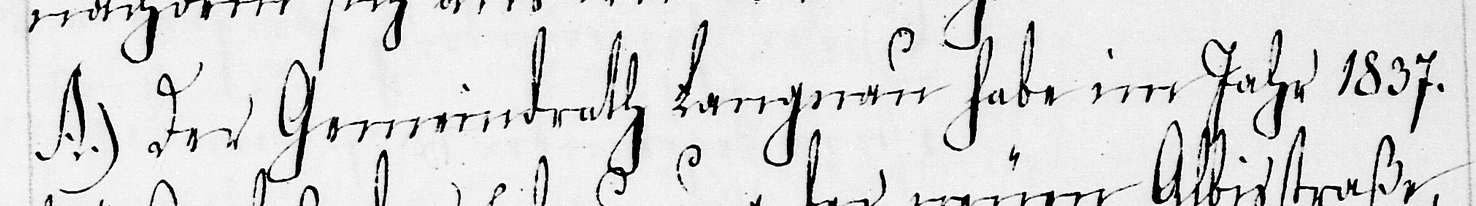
A.) Der Gemeindrath Langnau habe im Jahr 1837.
